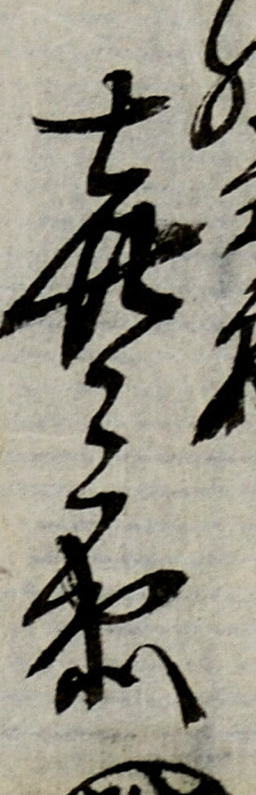喜兵衛
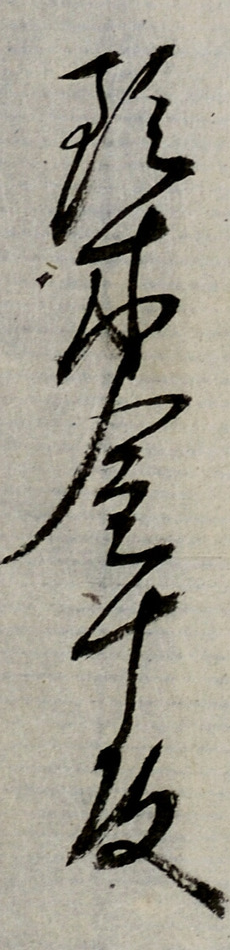鈴木金十殿

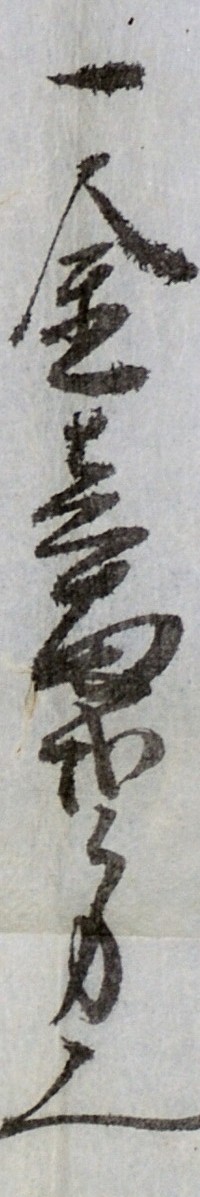一金壱両弐分也
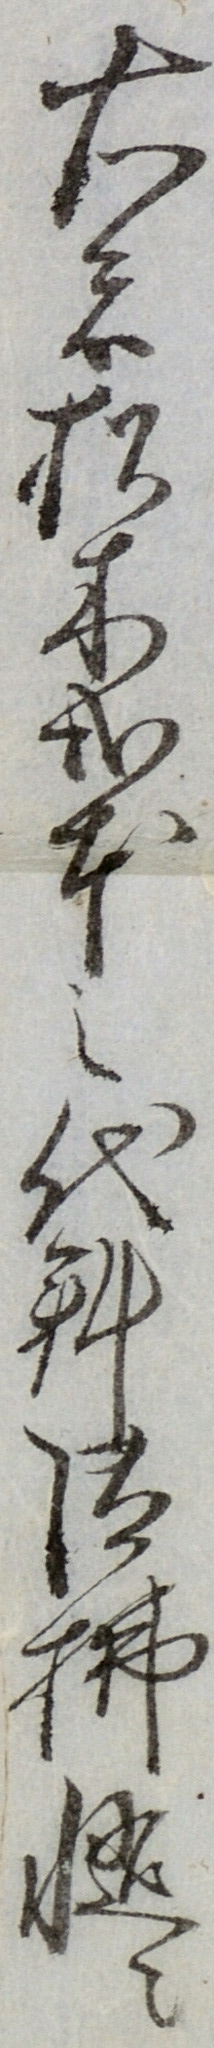右は松木弐本之代料御払慥ニ
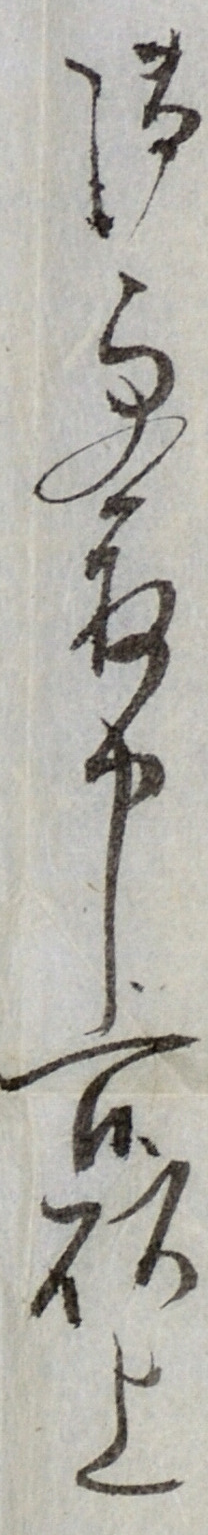御受取申上候以上
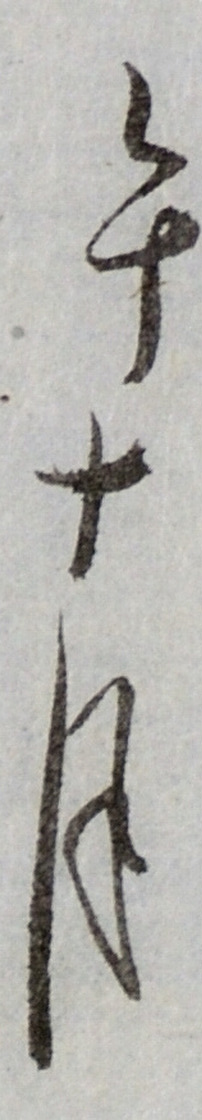午十月
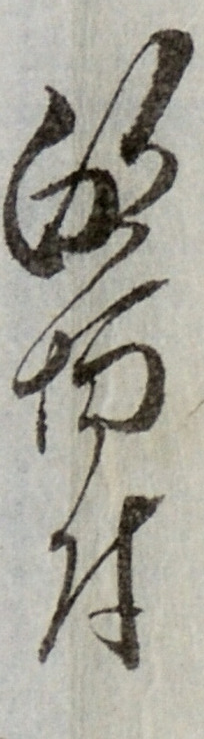的場村
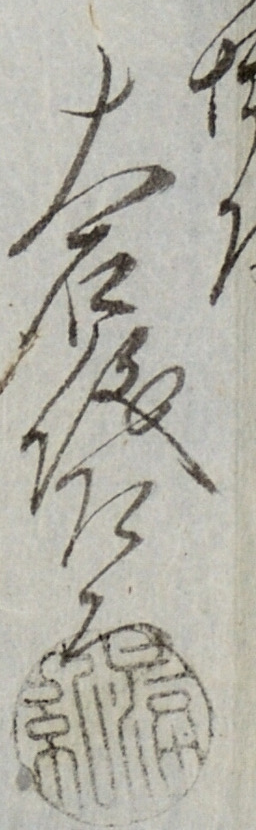大石儀左衛門
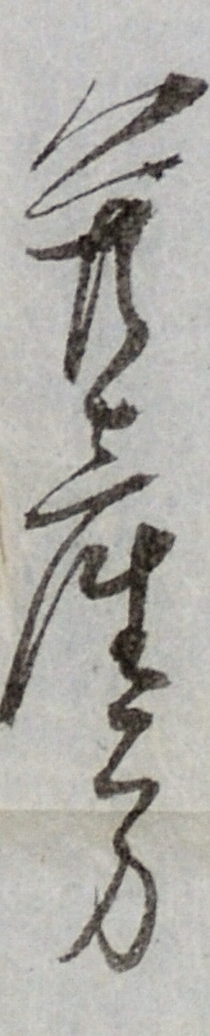開産方
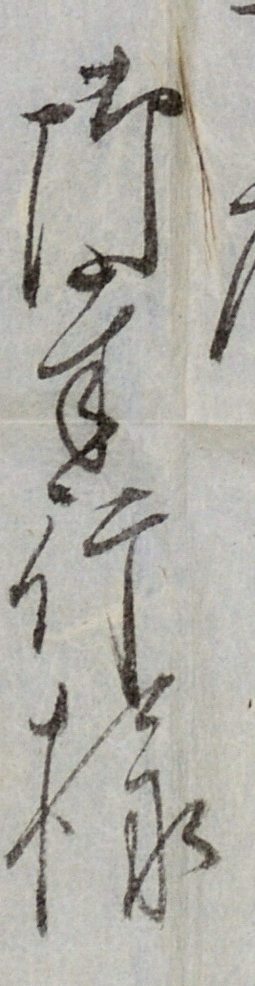御奉行様

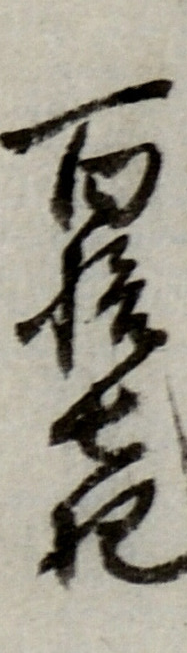百拾七把
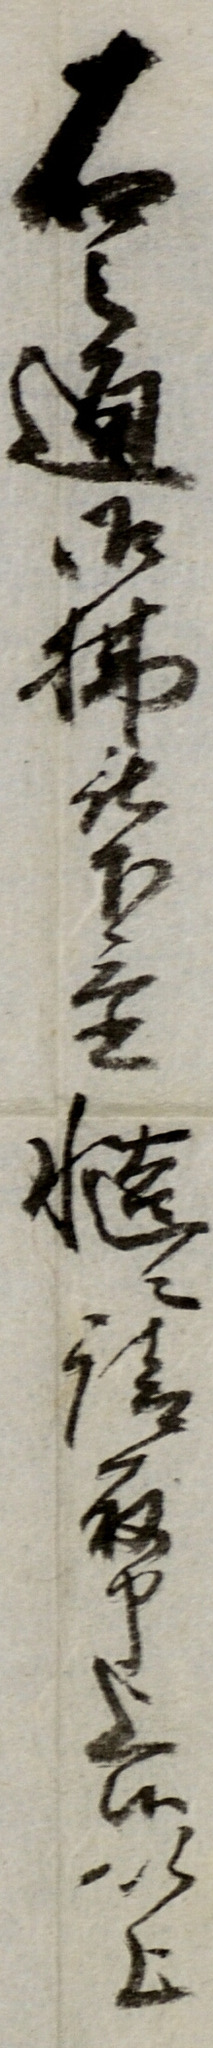右之通御払被下置慥ニ請取申上候以上
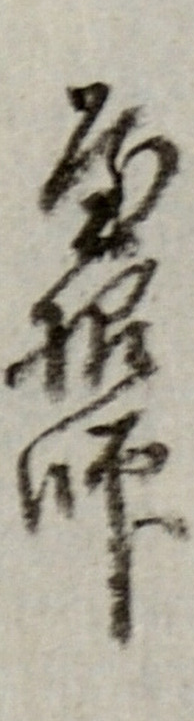屋根師
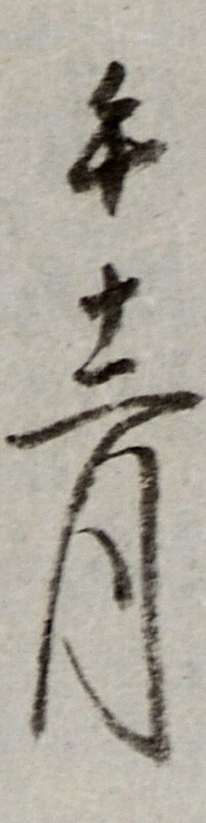午十二月
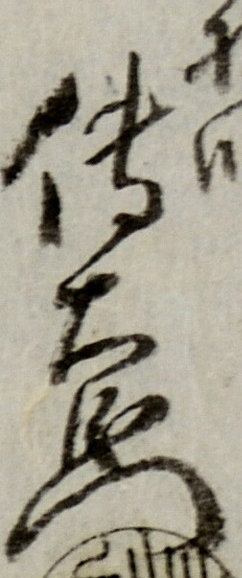伝右衛門
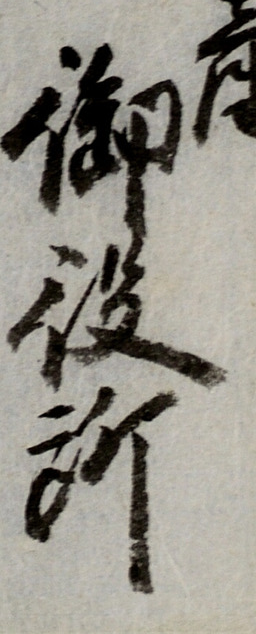御役所
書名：御山方御拂物代料取立帳
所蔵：伊那市立高遠町図書館・合同会社AMANE
